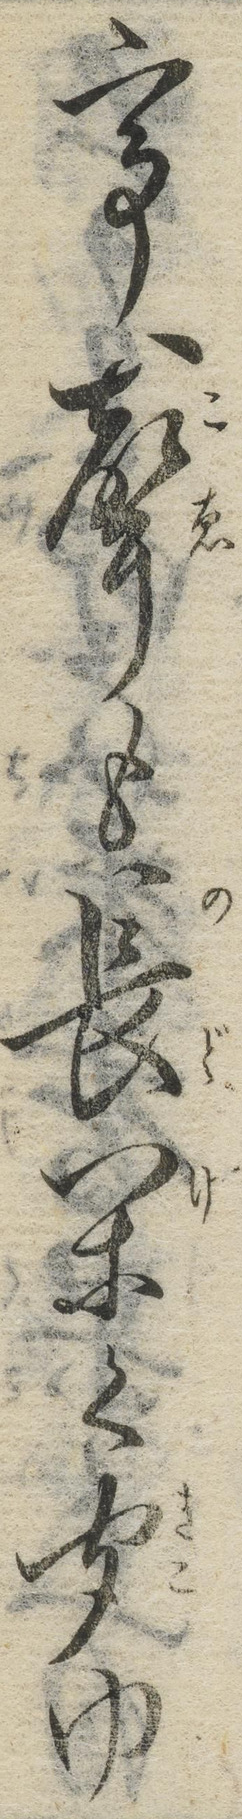て、声も、長閑く聞ゆ

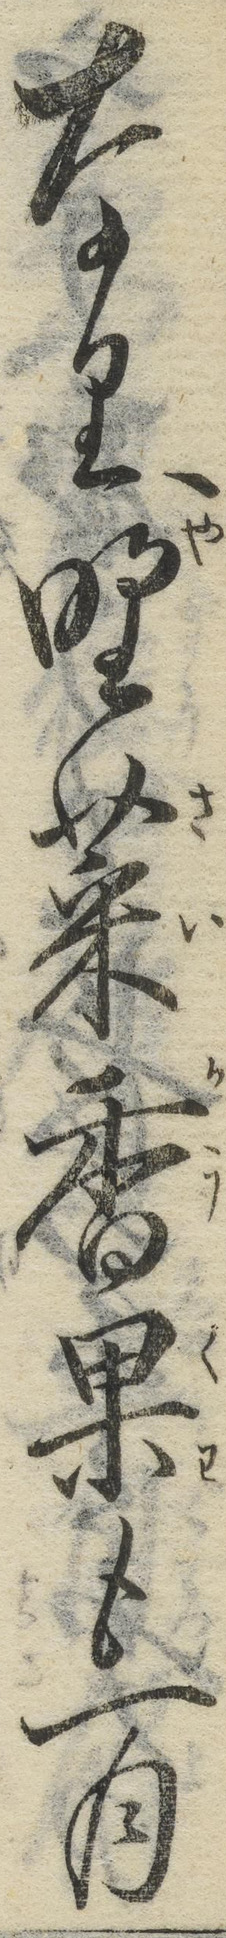なり、野菜香果も一月
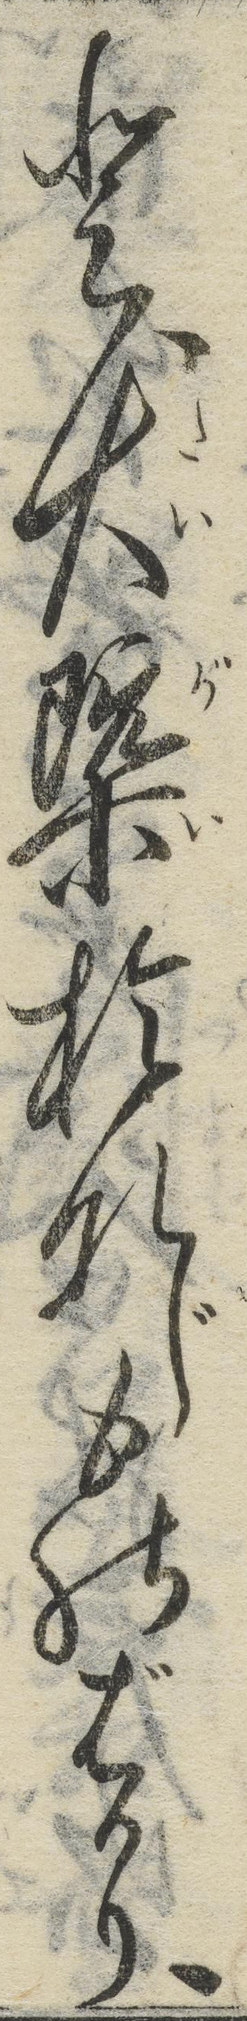と、大概おなじものばかり、
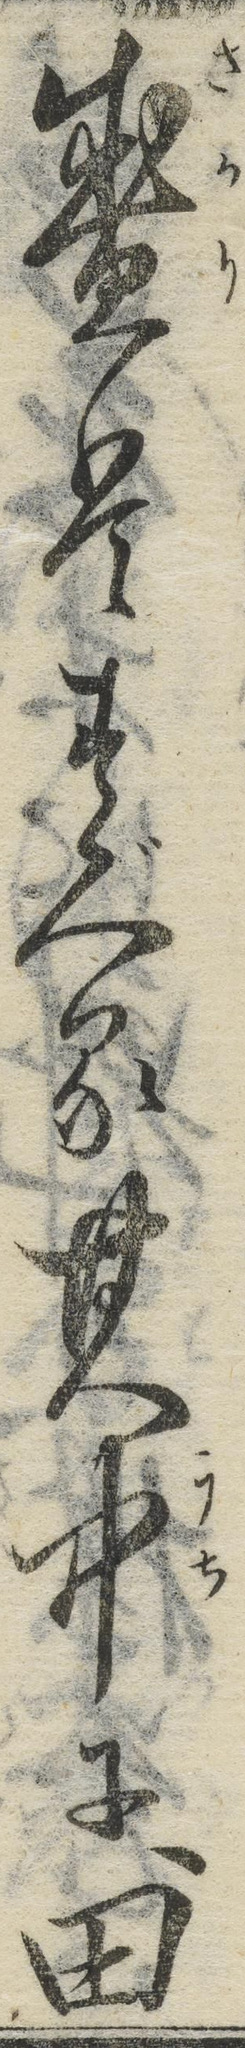盛はすぐる其中に、田
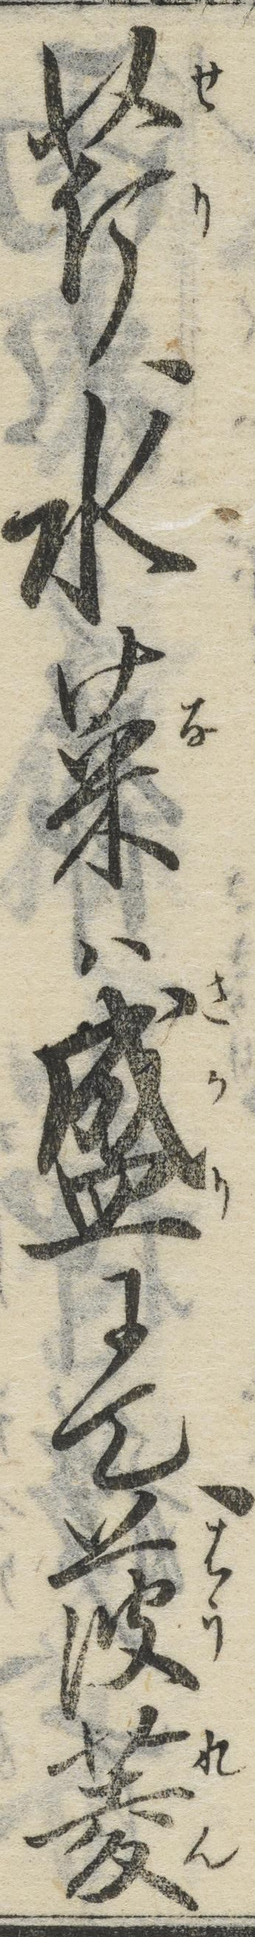芹、水菜は盛にて、菠菱
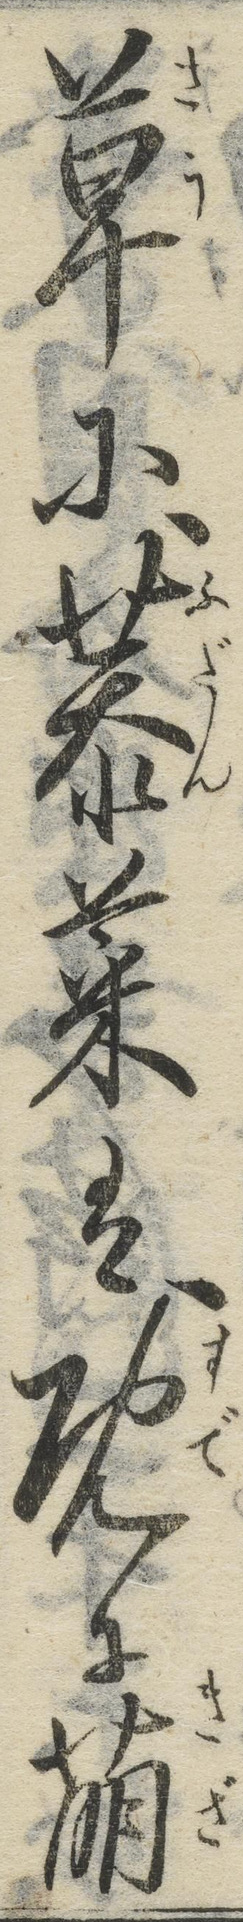草に、恭菜は、既に萌
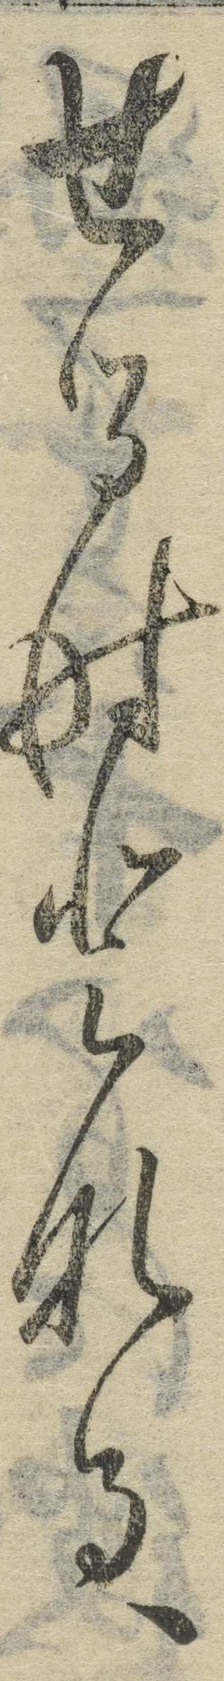せる時となる、
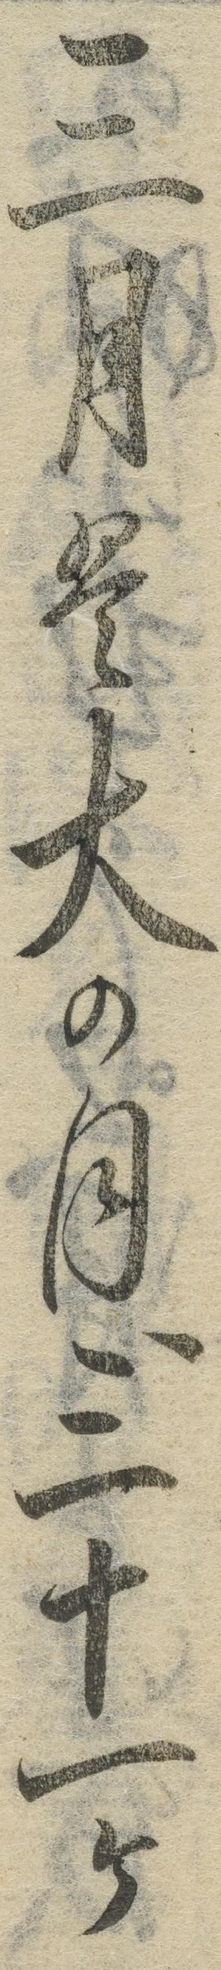三月は大の月、三十一ヶ
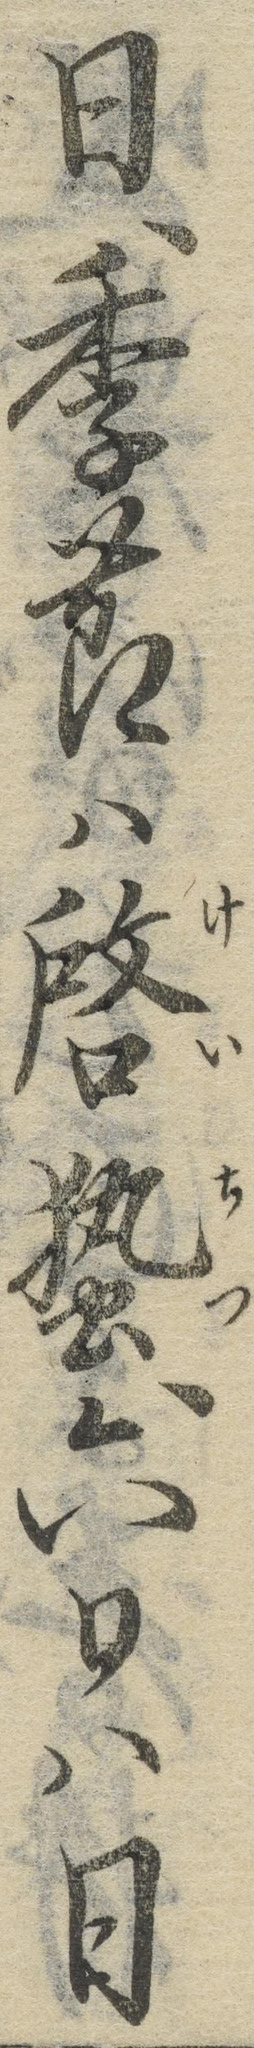日、季節は啓蟄、六日は日
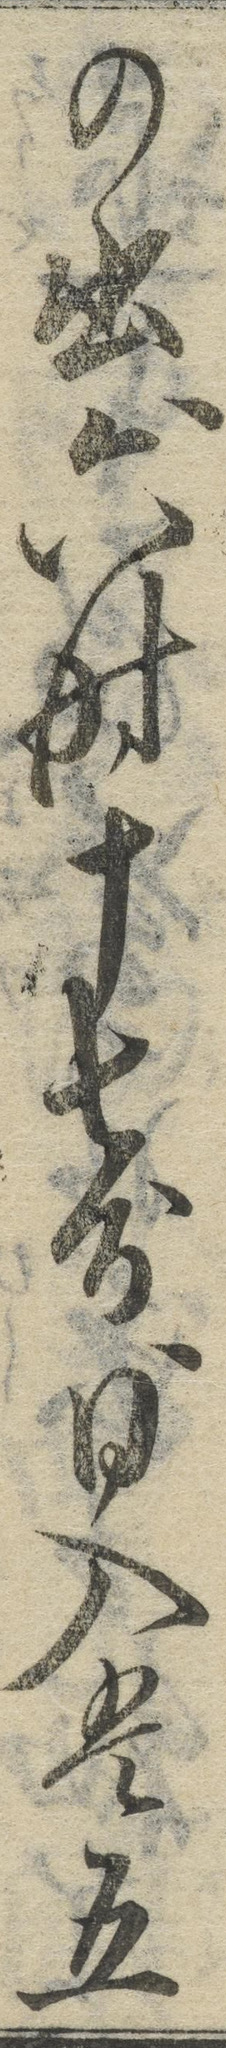の出、六時十七分、日入は五
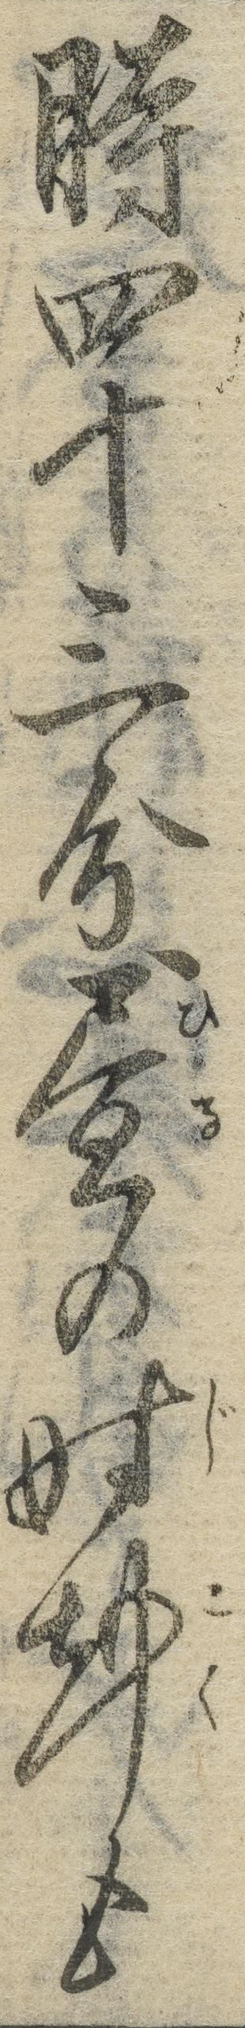時四十三分、昼の時刻も

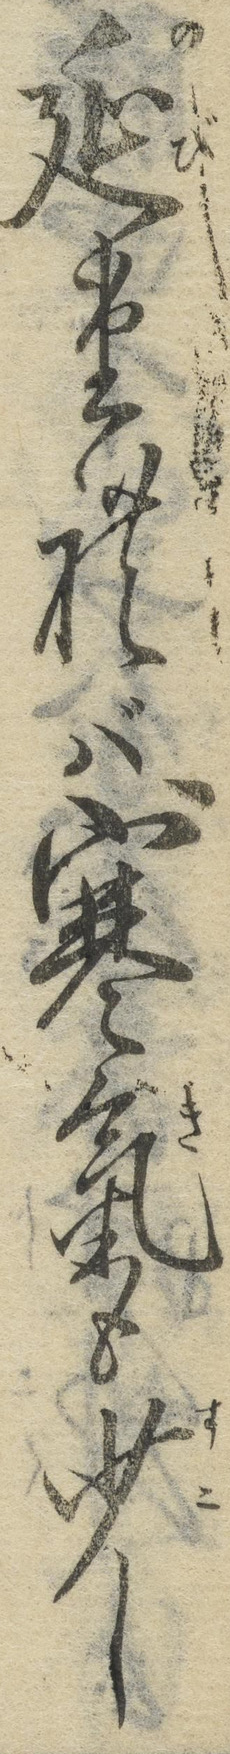延たれば、寒気も少し
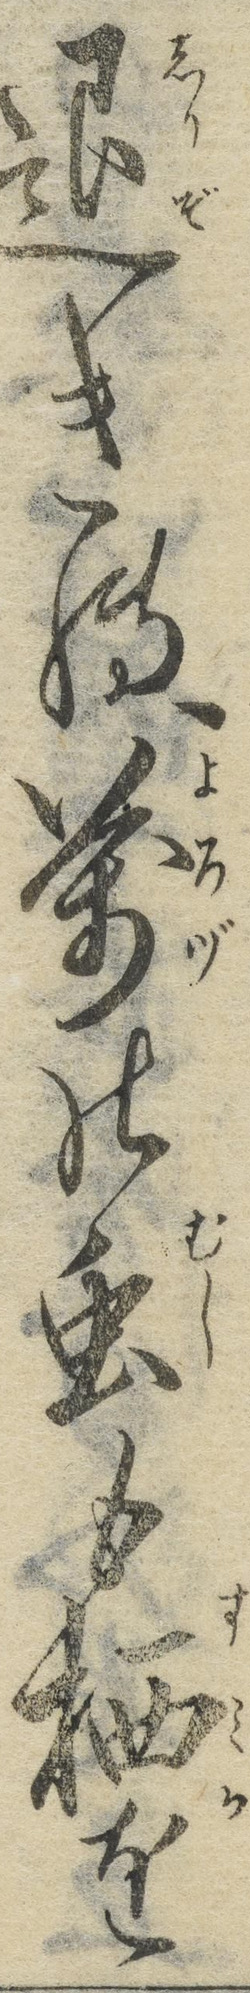退きて、万の虫も栖を
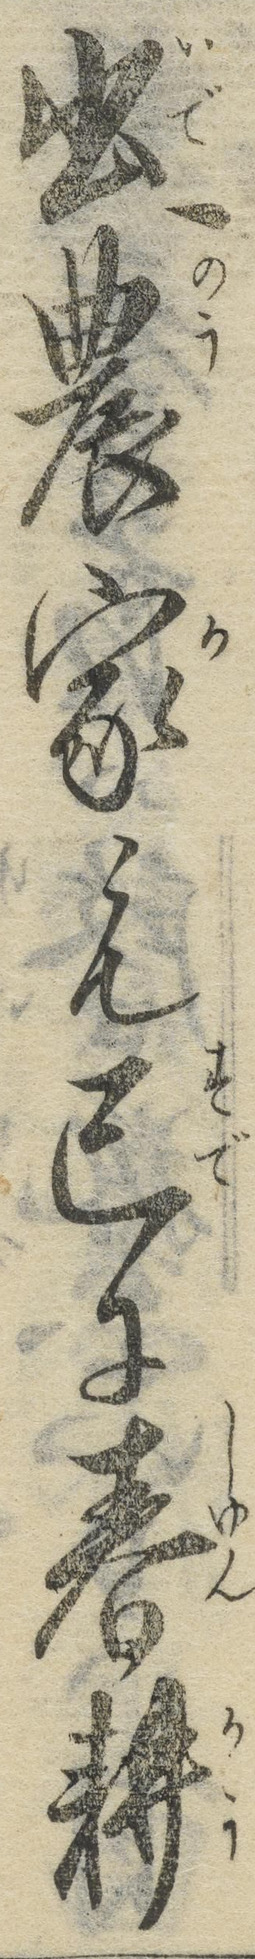出、農家も已に春耕
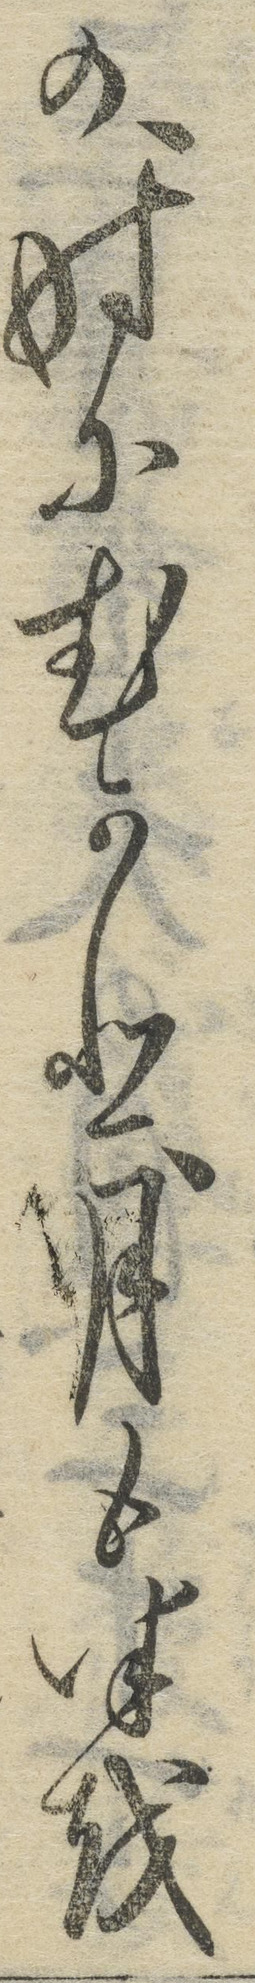の、時にむかひ、月も半を
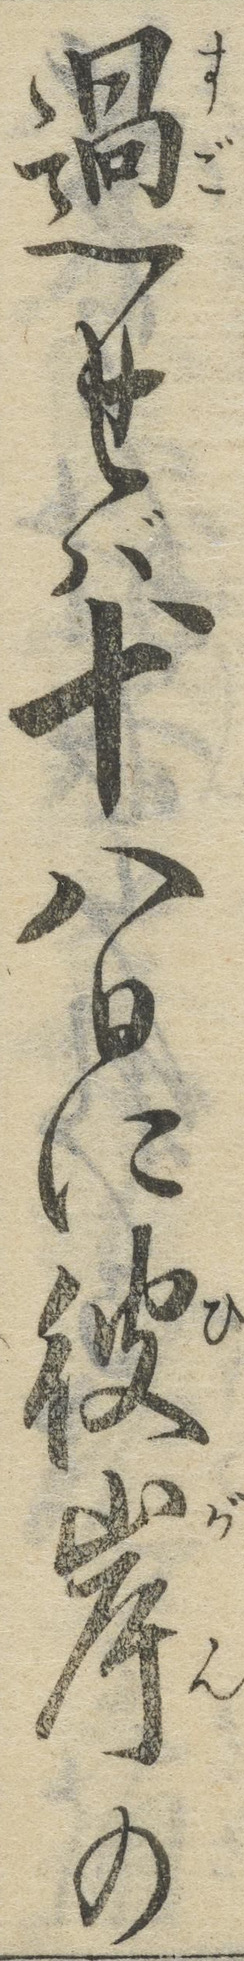過せば、十八日に彼岸の
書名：暦日往来　單
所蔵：東京大学地震研究所図書室 Earthquake Research Institute Library, The University of Tokyo, JAPAN
